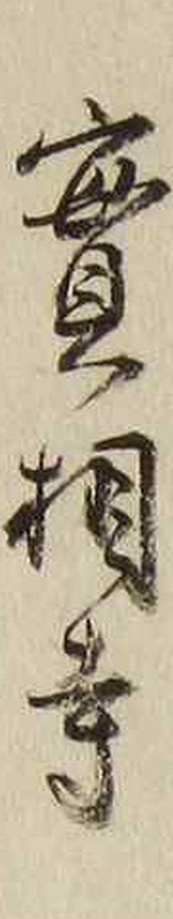実相寺
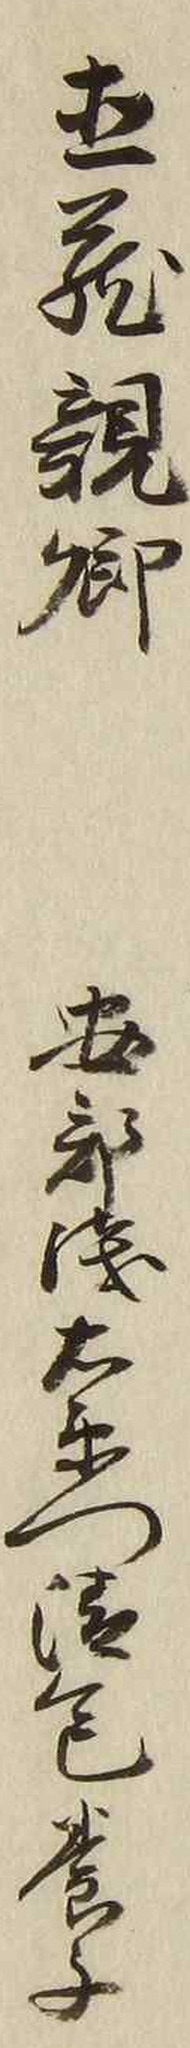直蔵親卿安部浅右衛門清包養子

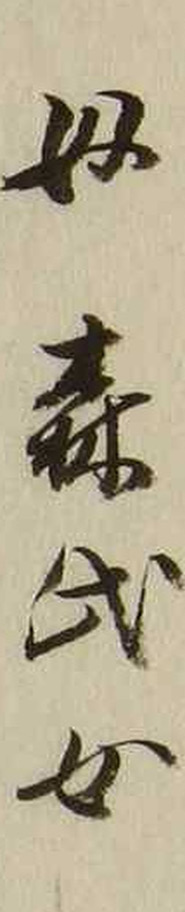母森氏女
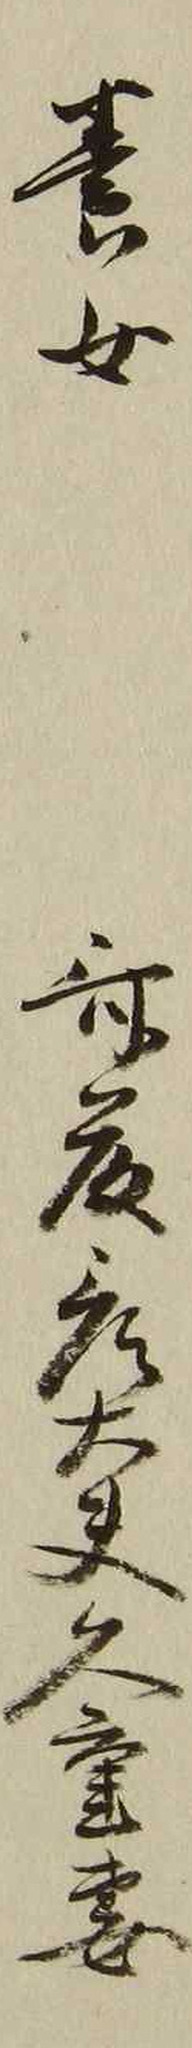養女斎藤彦大夫久重妻
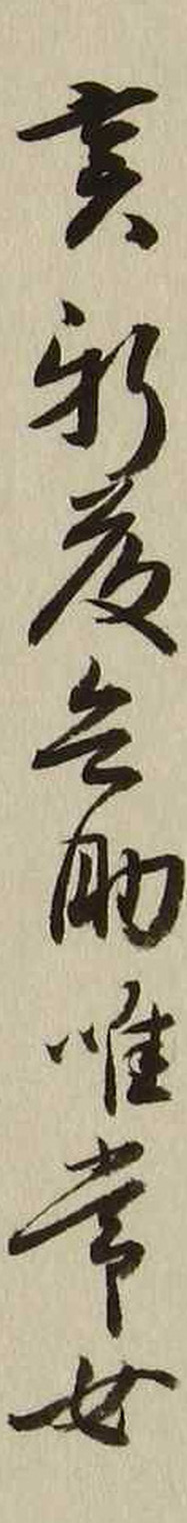実新藤兵助唯常女
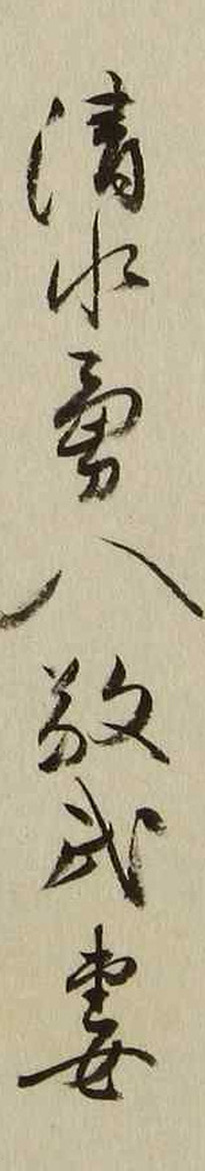女清水勇八敬武妻
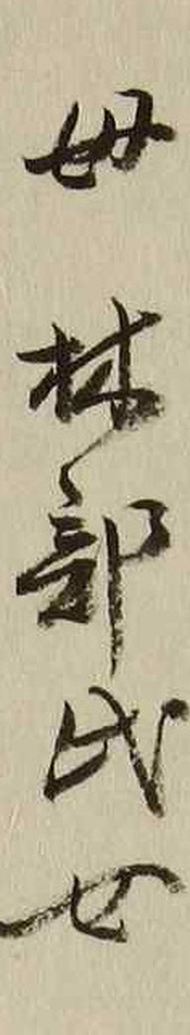母林部氏女
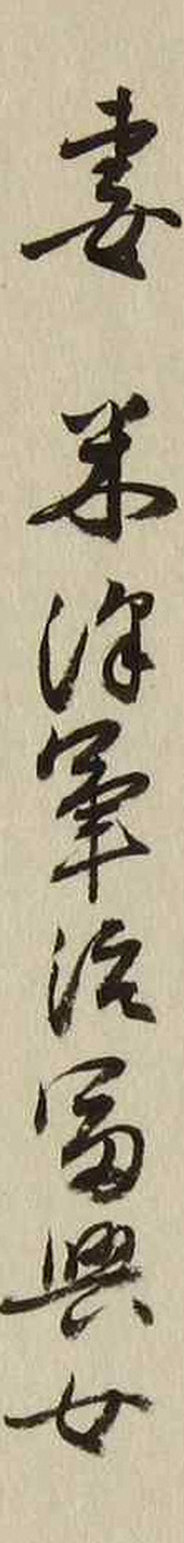妻米沢軍治富興女
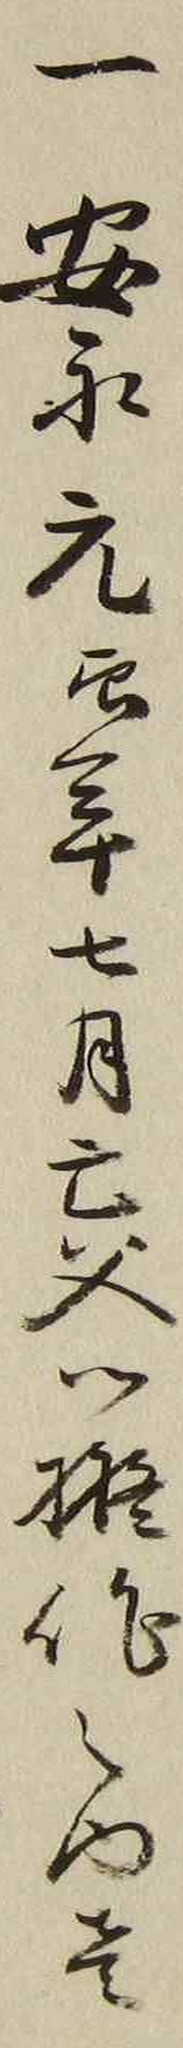一安永元辰年七月亡父御擬作之内壱
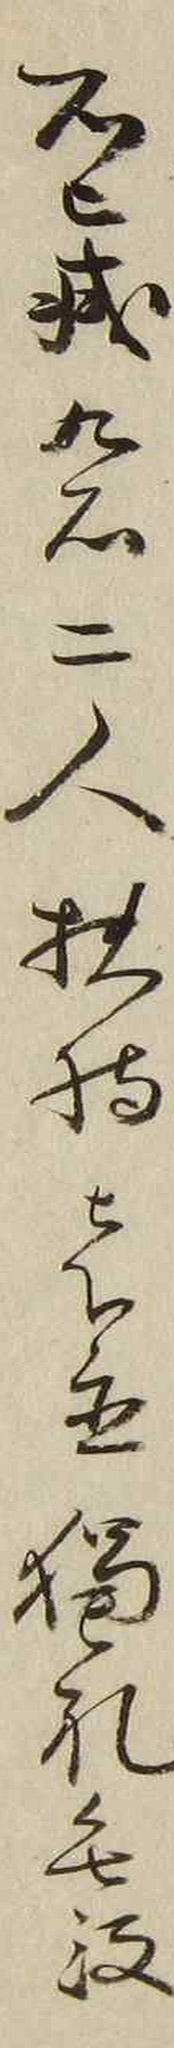石被減九石二人扶持被下置独礼無役

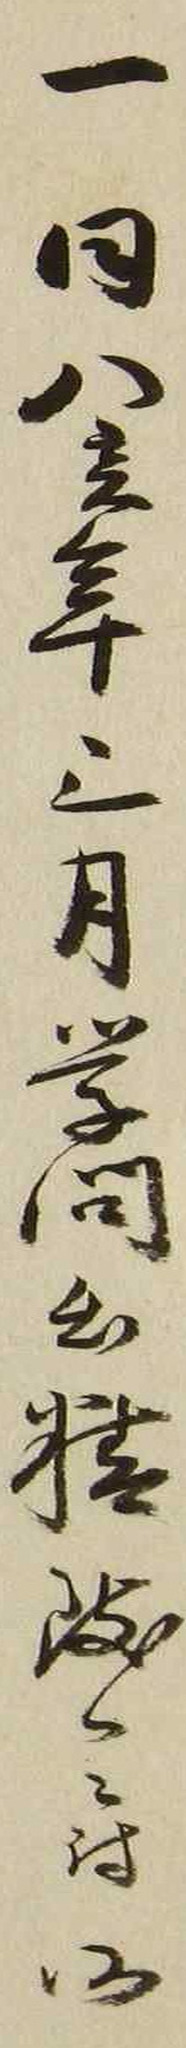一同八亥年三月学問出精致候ニ付御
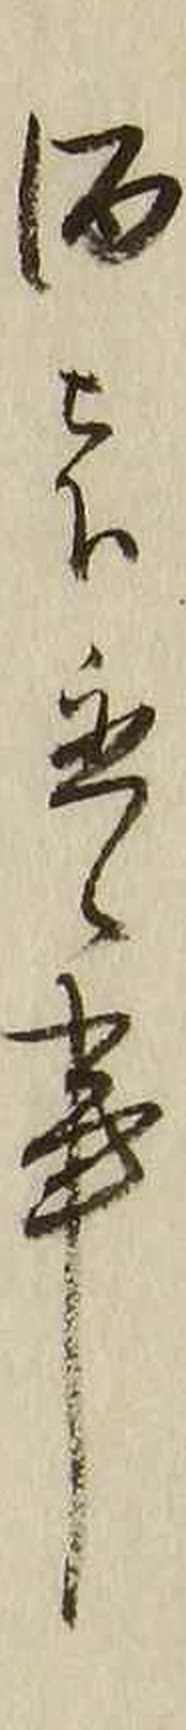酒被下置候事
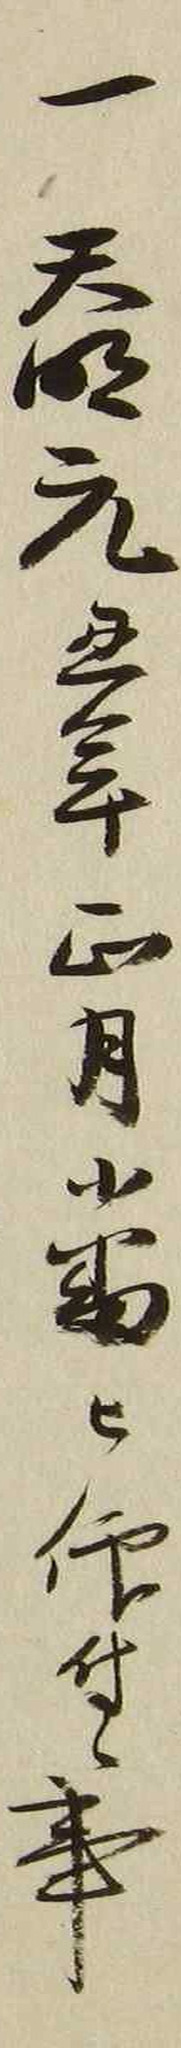一天明元丑年正月小番被仰付候事
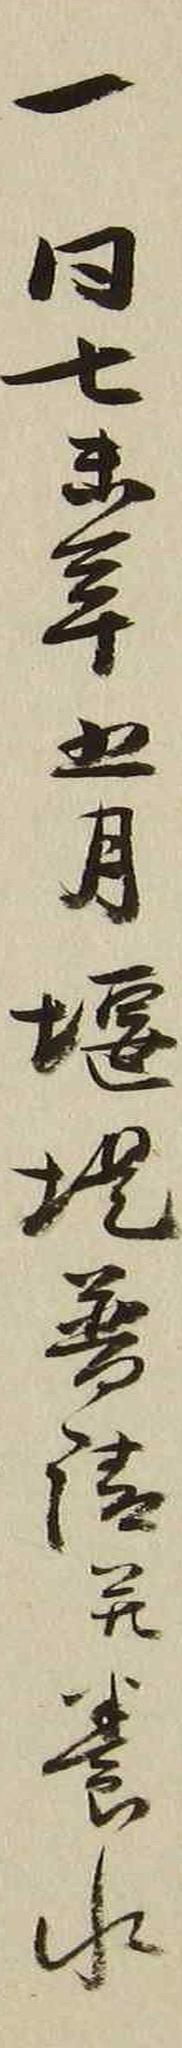一同七未年五月堰堤普請并養水
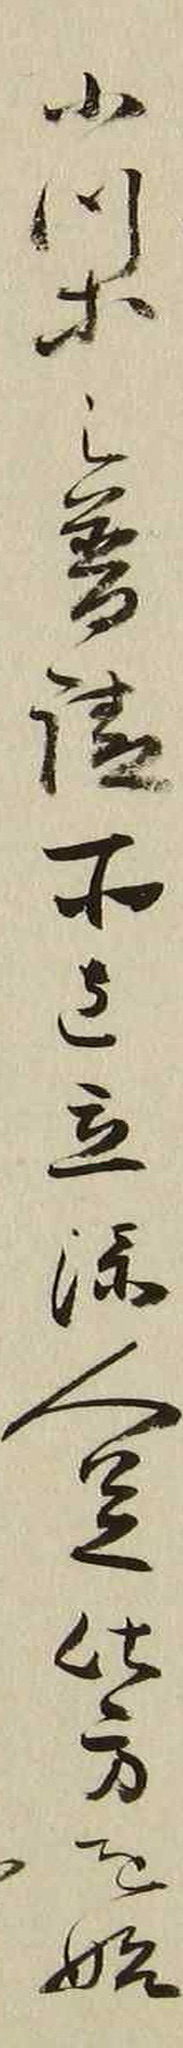小川等之普請所迄立添人足仕方を始
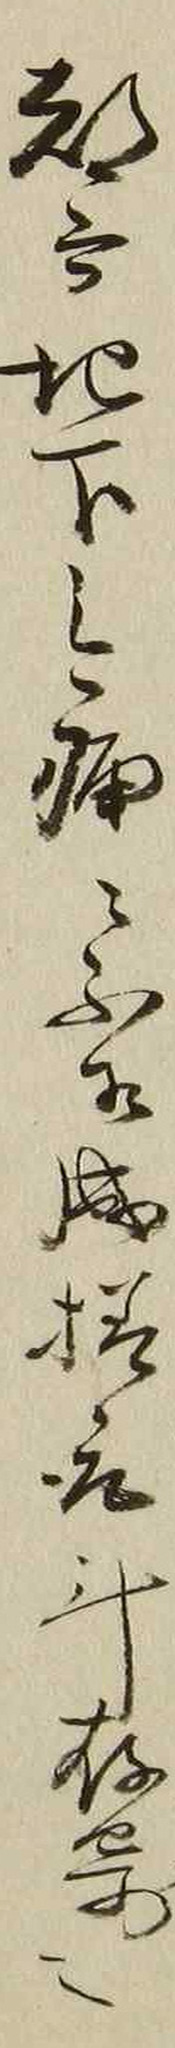都而地下之痛ニ不相成様取計存寄之
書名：諸士系譜　巻之288　さ之部20
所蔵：会津若松市立会津図書館
